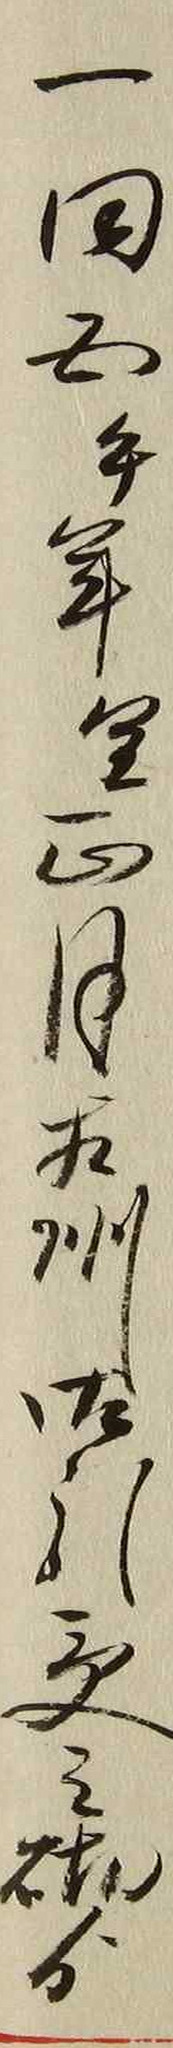一同五午年閏正月相州御引受之砌ゟ
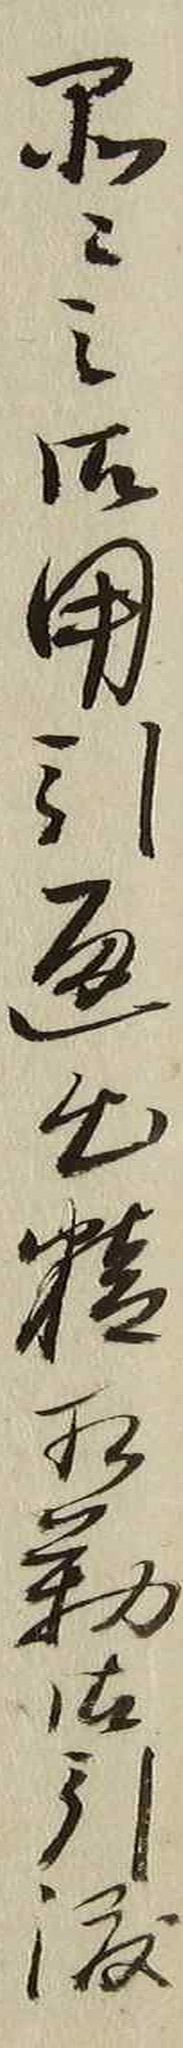品々之御用引通出精相勤御引渡
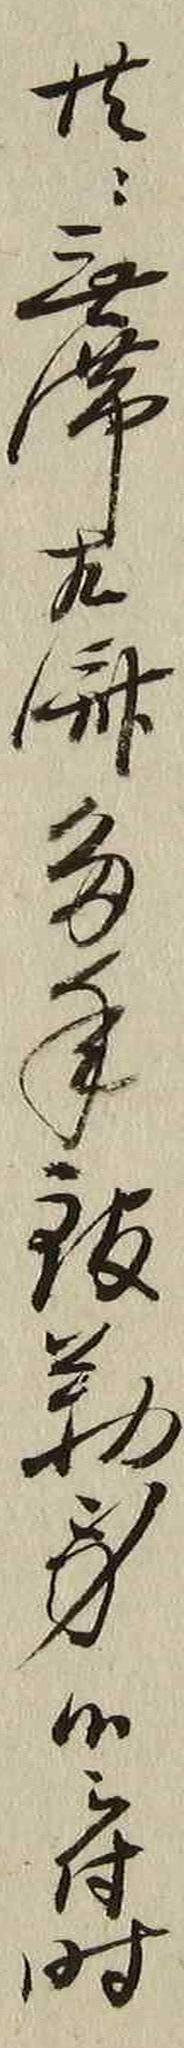共ニ無滞相済多年致勤身候ニ付時
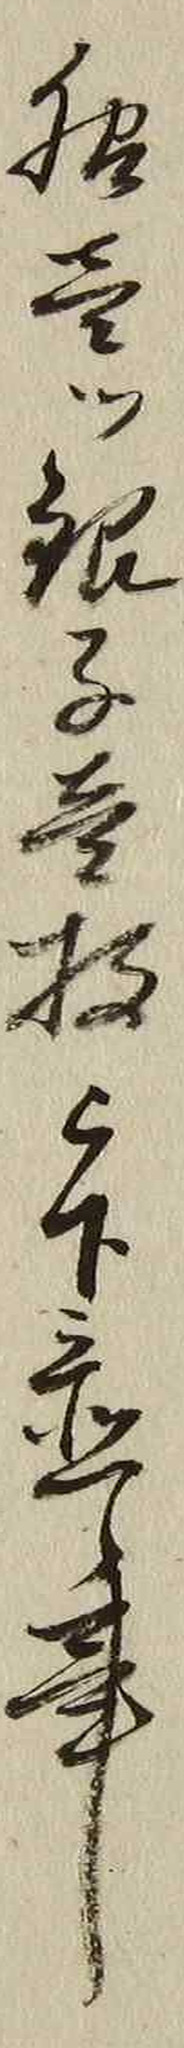服壱ツ銀子壱枚被下置候事
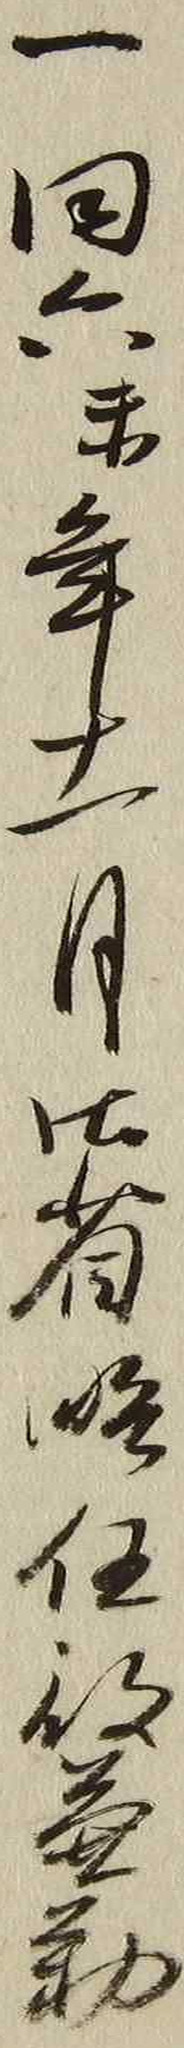一同六末年十一月御省略任役兼勤
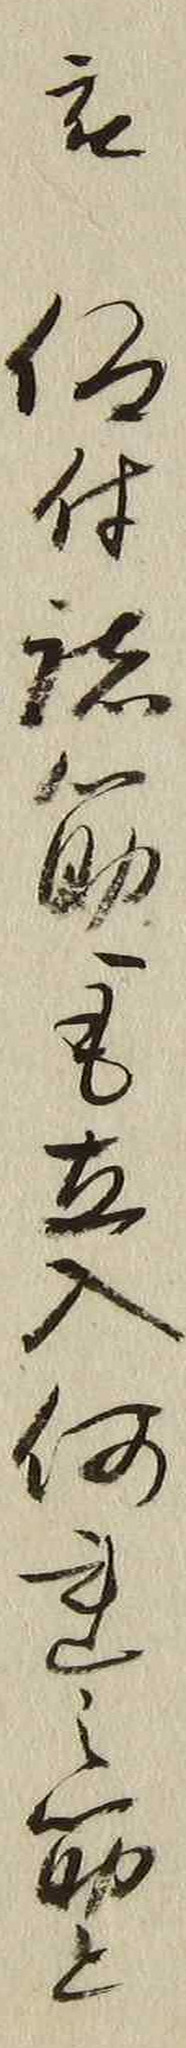被仰付諸筋へも立入何れ之筋と
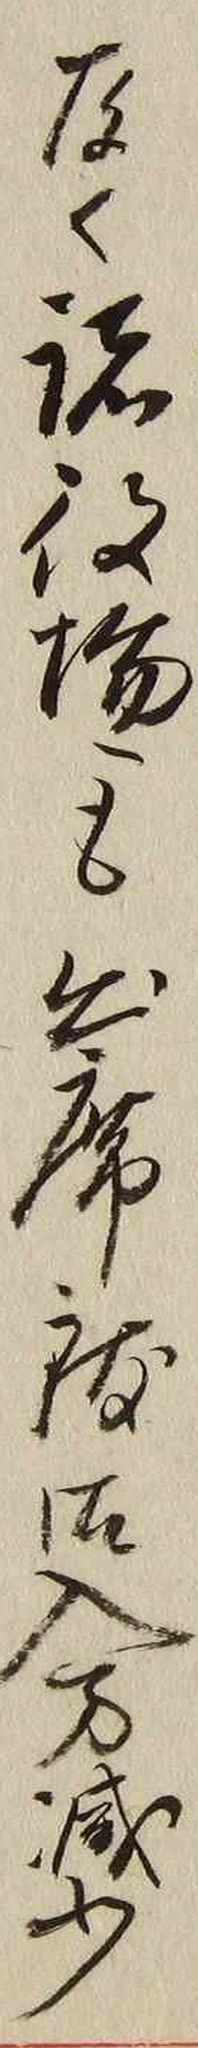なく諸役場へも出席致御入方減少
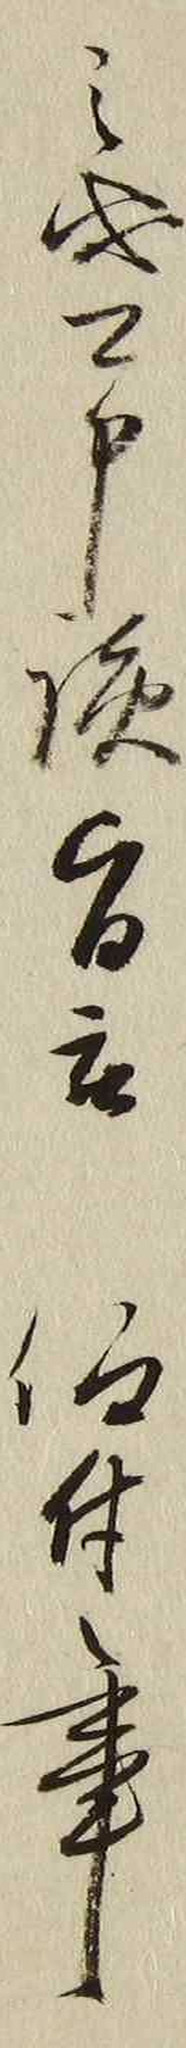之儀可申談旨被仰付候事
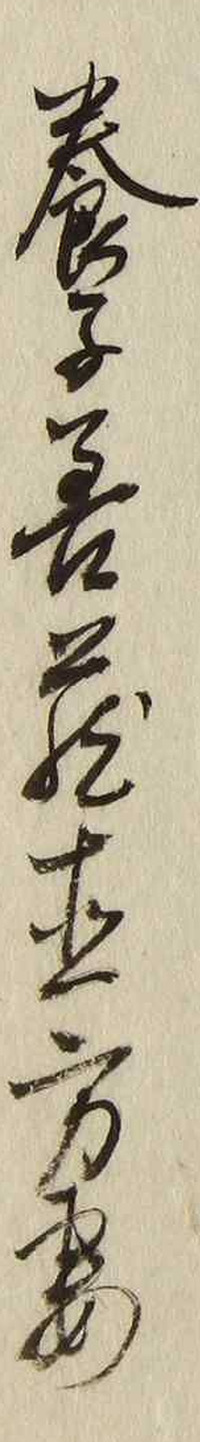女養子善蔵直方妻

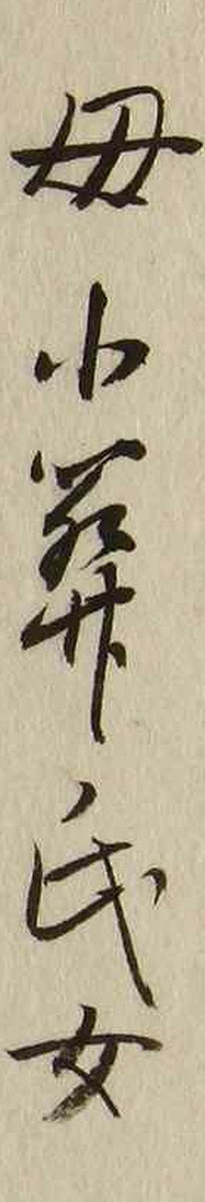母小関氏女
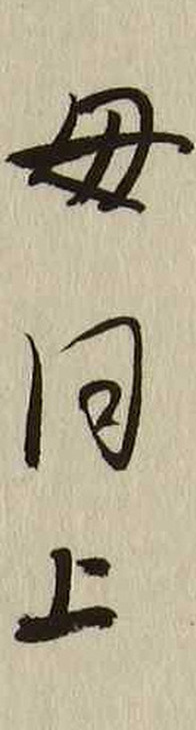母同上
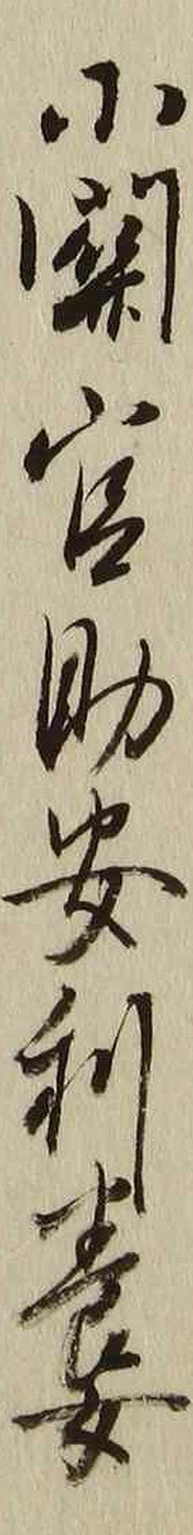女小関官助安利養女
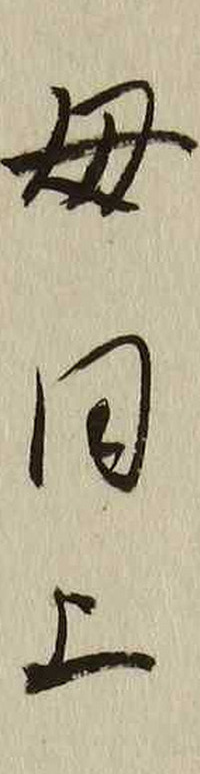母同上
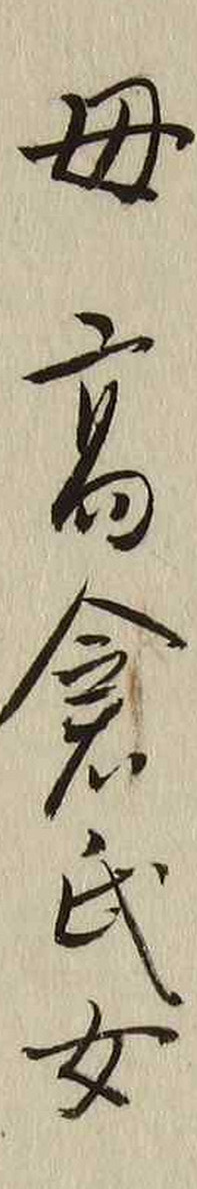母高倉氏女
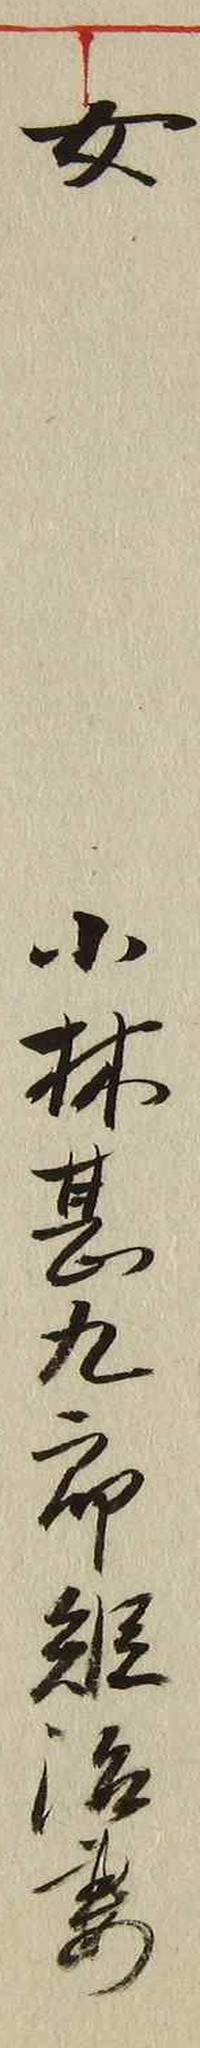女小林甚九郎矩治妻
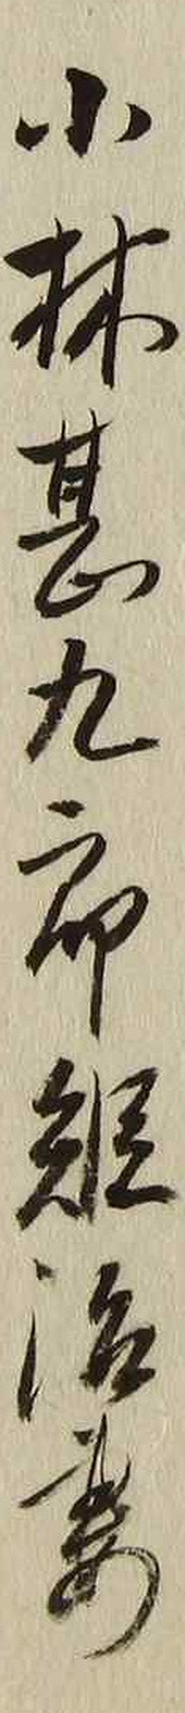女小林甚九郎矩治妻
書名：諸士系譜　巻之352　す之部2
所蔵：会津若松市立会津図書館
